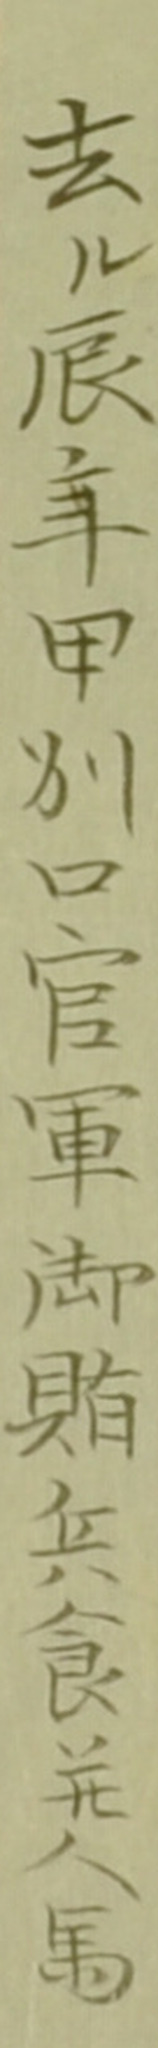去ル辰年甲州口官軍御賄兵食并人馬
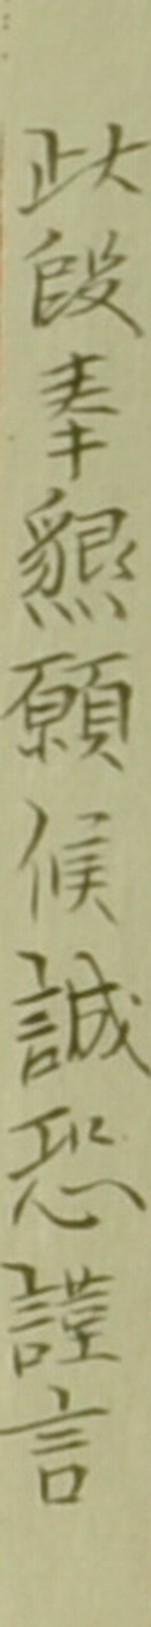此段奉懇願候誠恐謹言
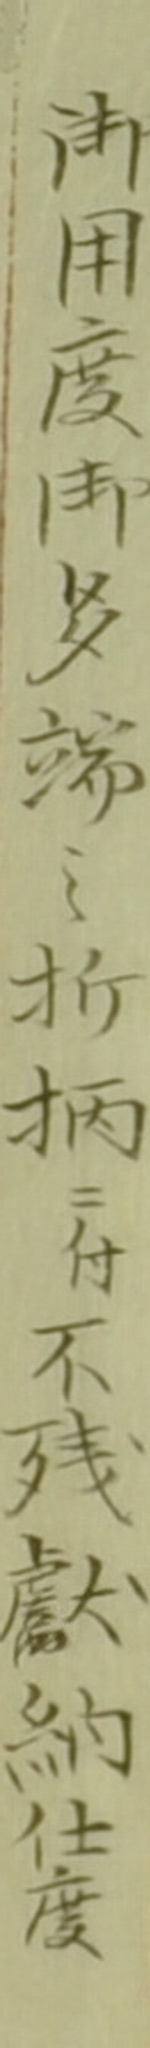御用度御多端之折柄ニ付不残献納仕度

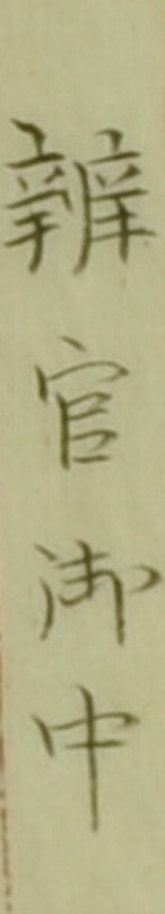弁官御中
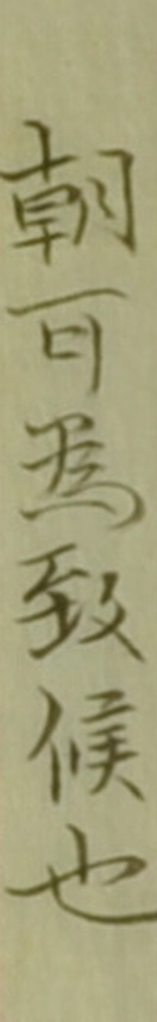朝可為致候也
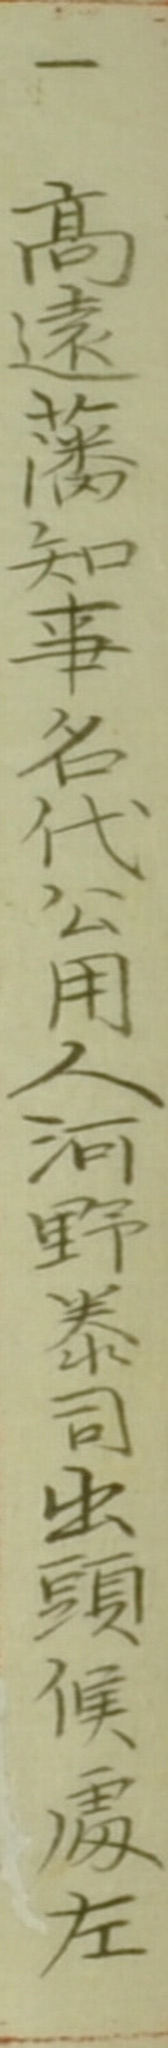一高遠藩知事名代公用人河野泰司出頭候処左
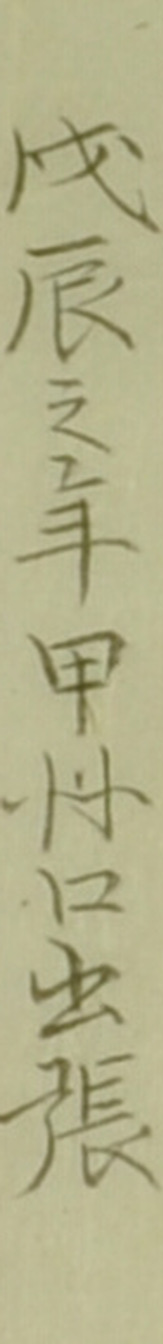戊辰之年甲州口出張
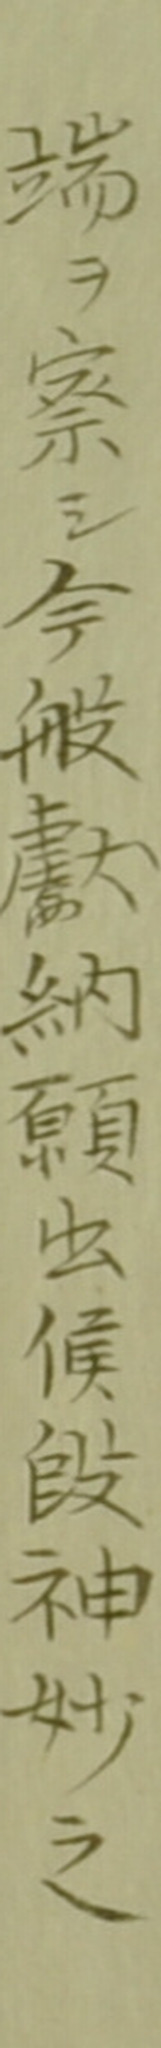端ヲ察シ今般献納願出候段神妙之
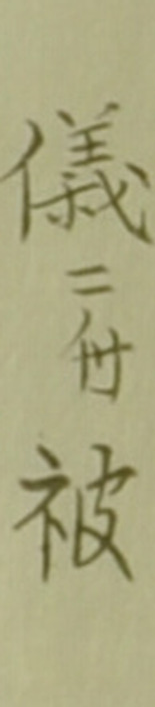儀ニ付被
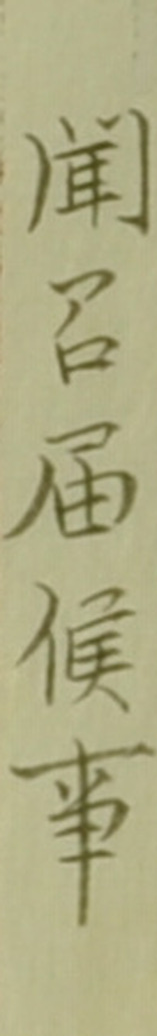聞召届候事

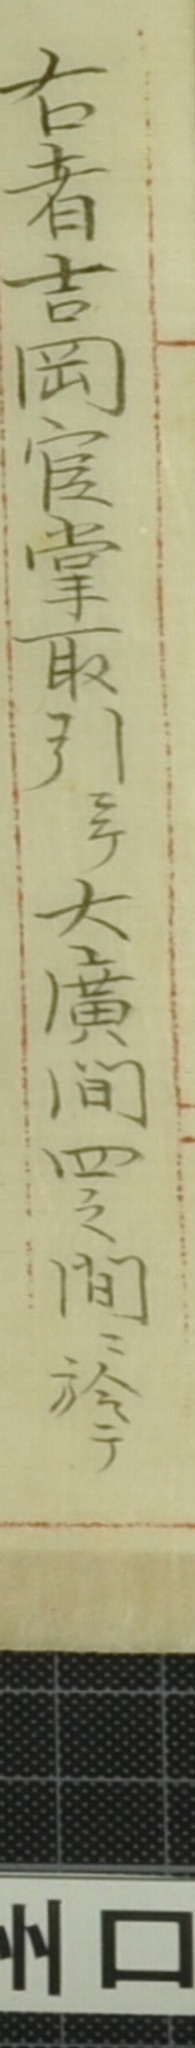右者吉岡官掌取引ニテ大広間四之間ニ於テ
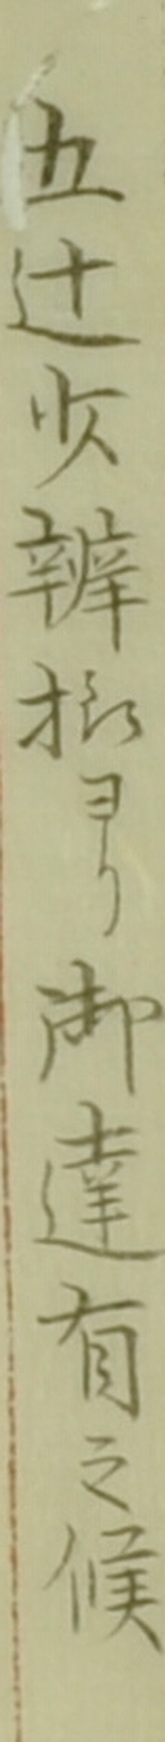五辻少弁様ヨリ御達有之候
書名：御東征ニ付甲州口兵食人馬御賄之事件（控）
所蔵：伊那市立高遠町図書館・合同会社AMANE
